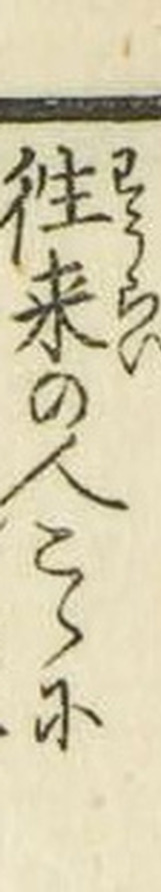往来の人こゝに
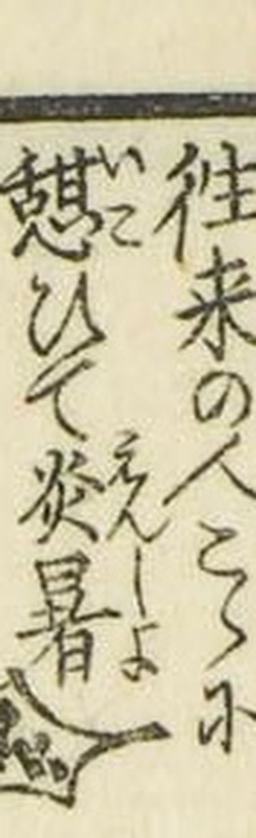憩ひて炎暑
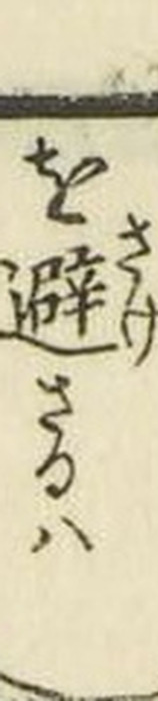を避さるは
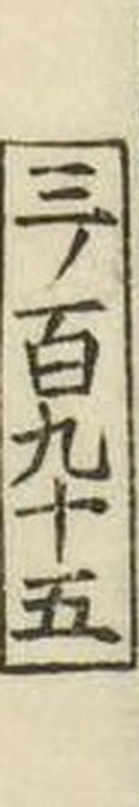三ノ百九十五
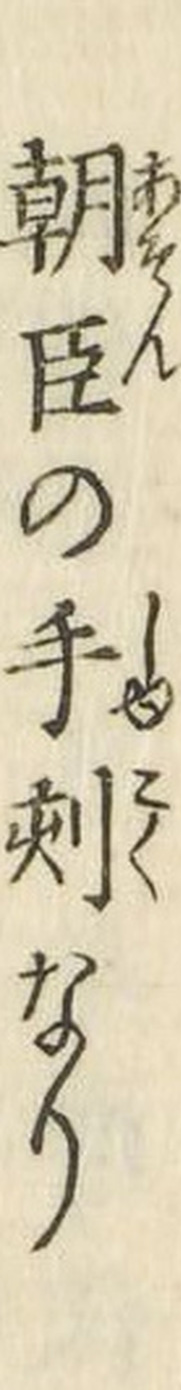朝臣の手刻なり
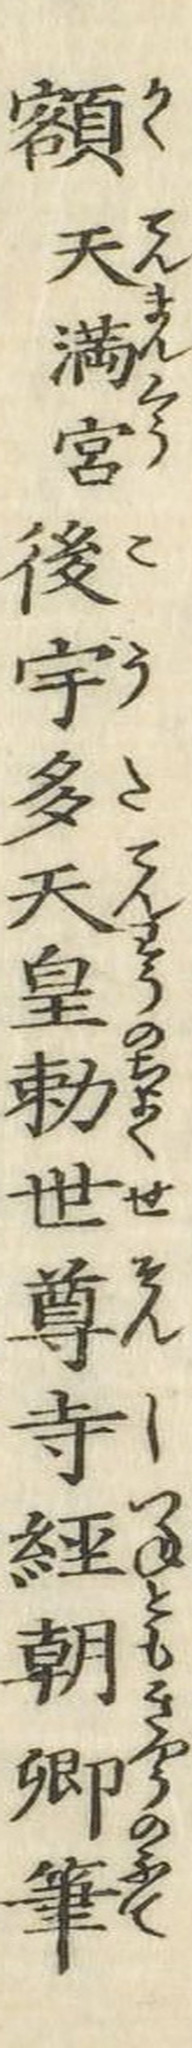額天満宮後宇多天皇勅世尊寺経朝卿筆
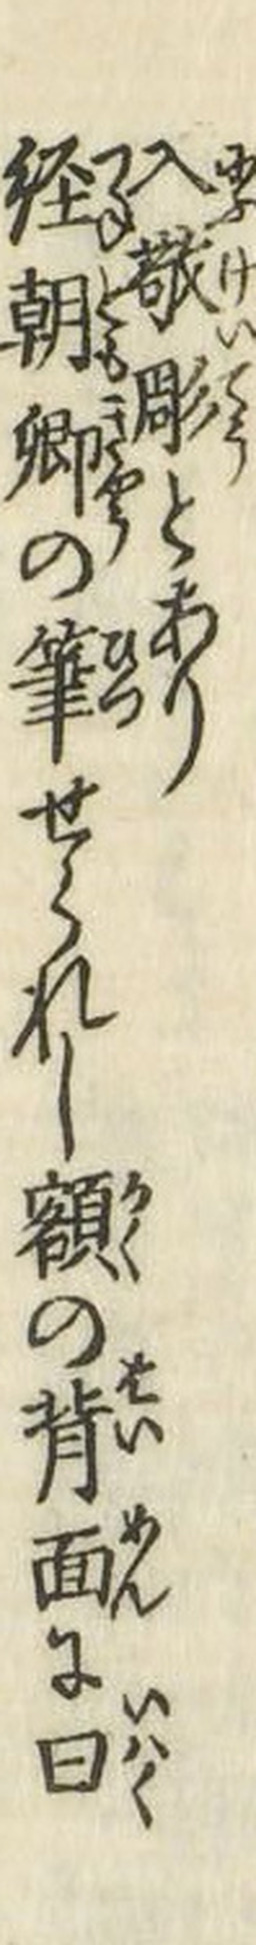経朝卿の筆せられし額の背面に曰
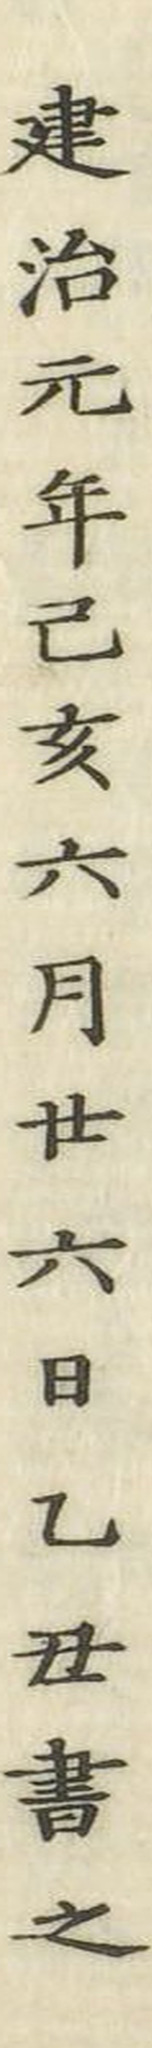建治元年己亥六月廿六日乙丑書也
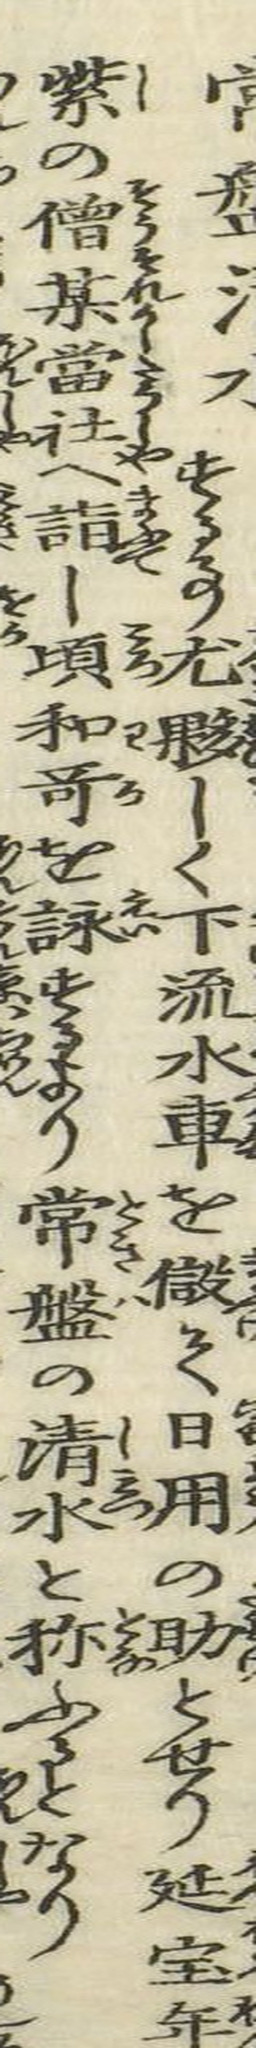紫の僧某当社へ詣し頃和哥を詠するより常盤の清水と称ふるとなり
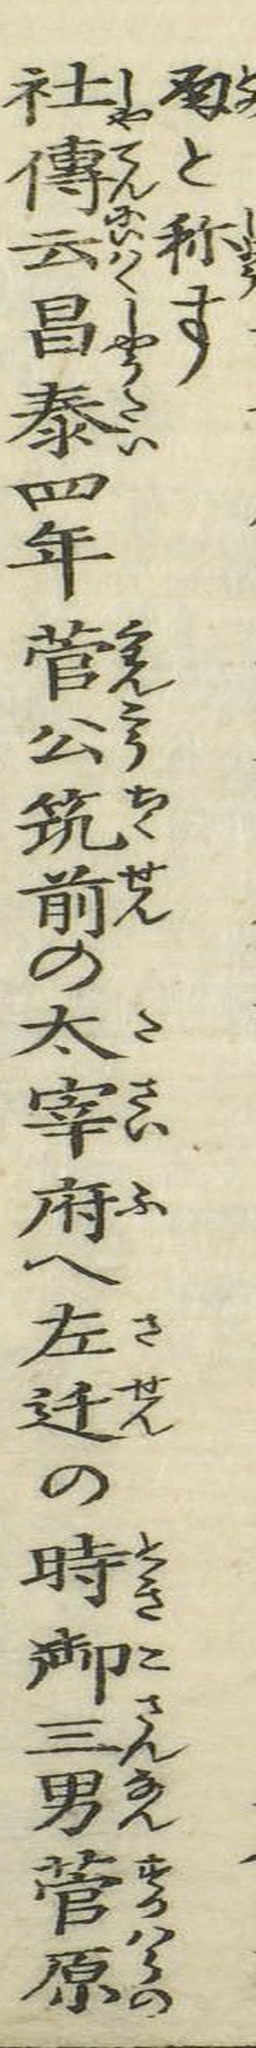社伝云昌泰四年菅公筑前の太宰府へ左遷の時御三男菅原
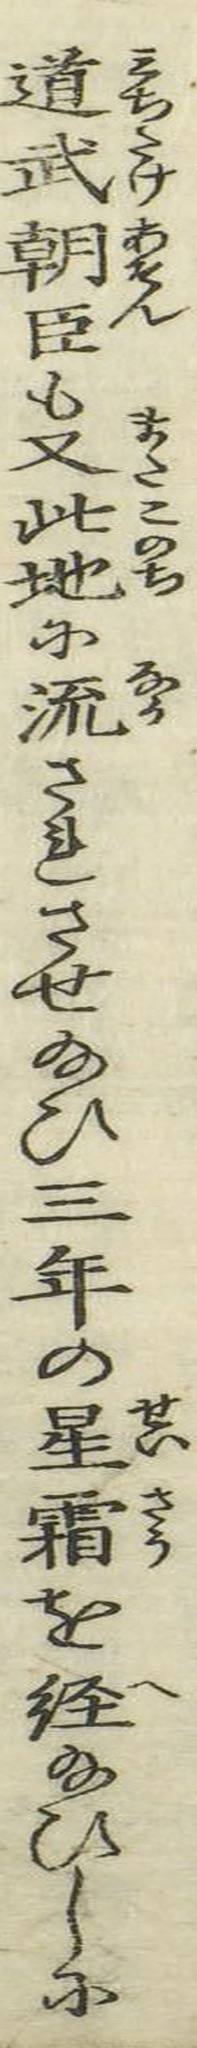道武朝臣も又此地に流されさせ給ひ三年の星霜を経給ひしに
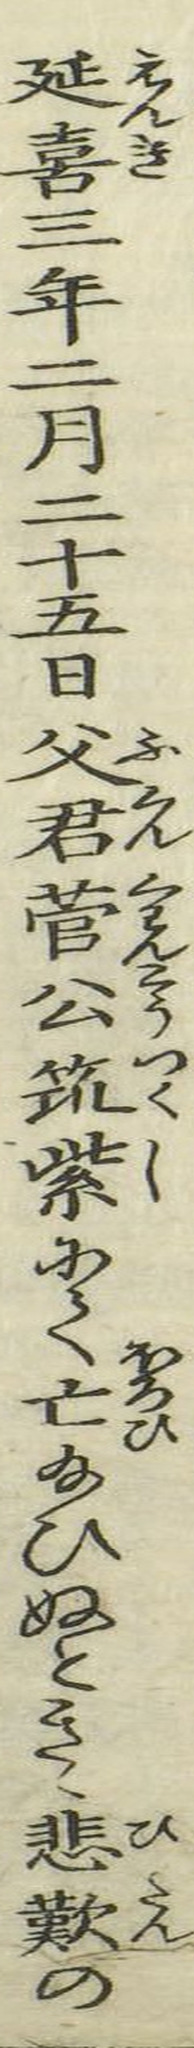延喜三年二月二十五日父君菅公筑紫にて亡給ひぬときゝ悲歎の
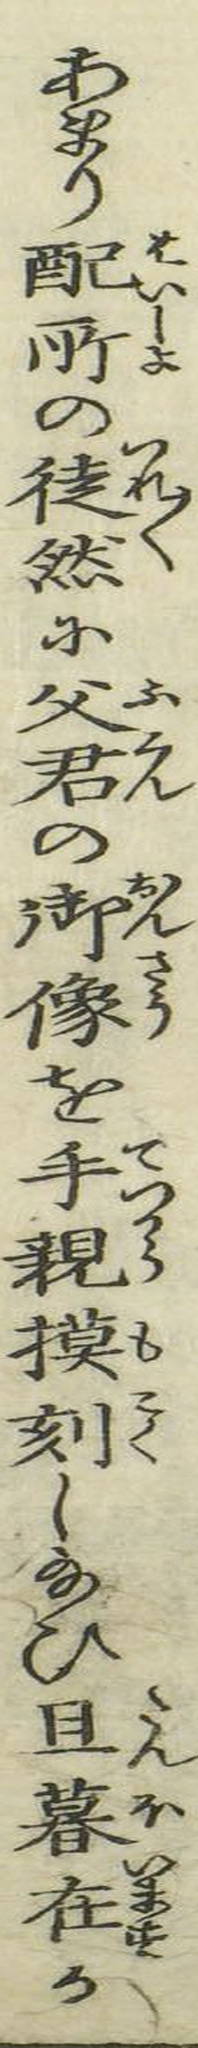あまり配所の徒然に父君の御像を手親摸刻し給ひ旦暮在か

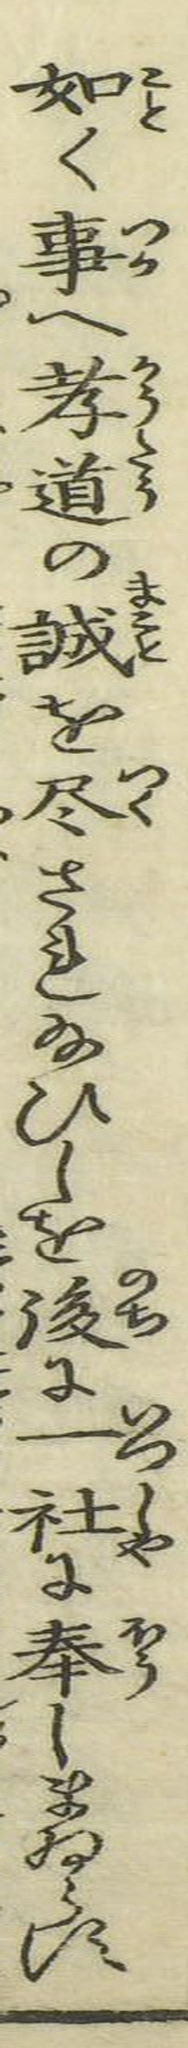如く事へ孝道の誠を尽され給ひしを後に一社に奉しまゐらす
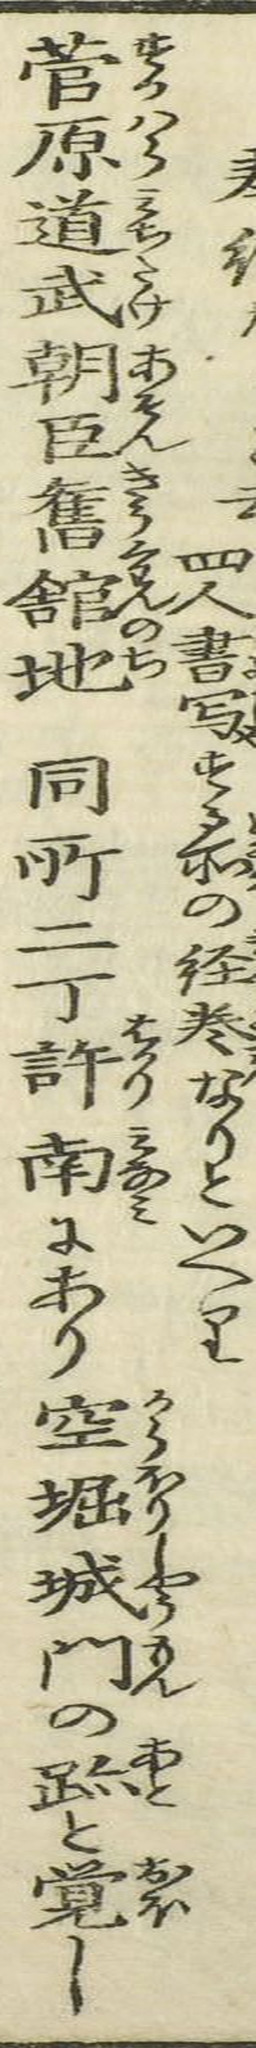菅原道武朝臣旧館地同所二丁許南にあり空堀城門の跡と覚し
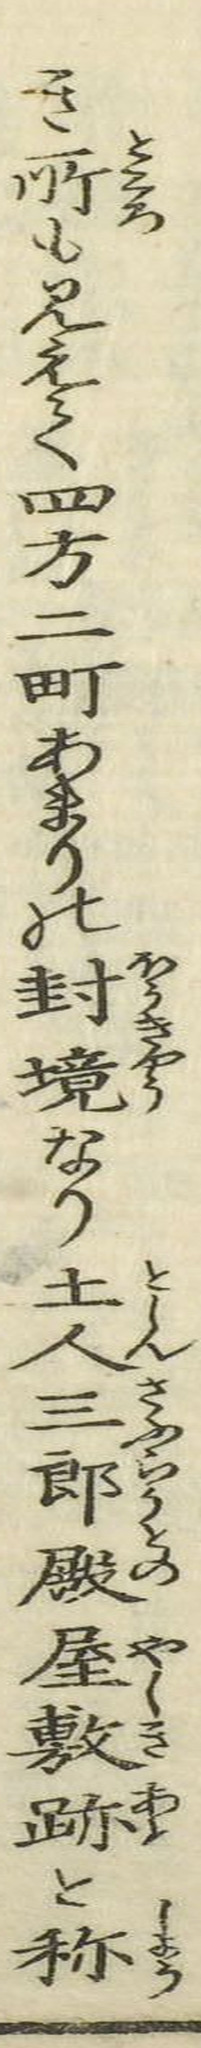き所も見えて四方二町あまりの封境なり土人三郎殿屋敷跡と称
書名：江戸名所図会 20巻 巻之10
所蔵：東京学芸大学教育コンテンツアーカイブ
